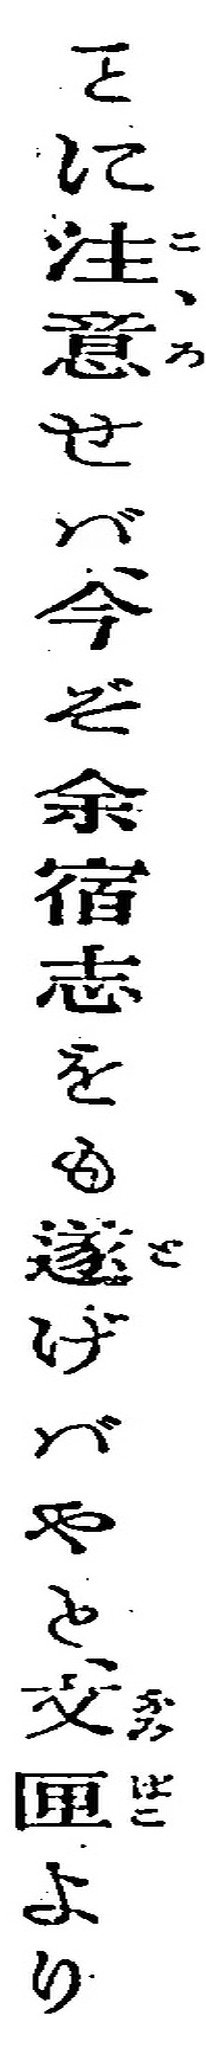ことに注意せば、今ぞ余宿志をも遂げばやと、文匣より
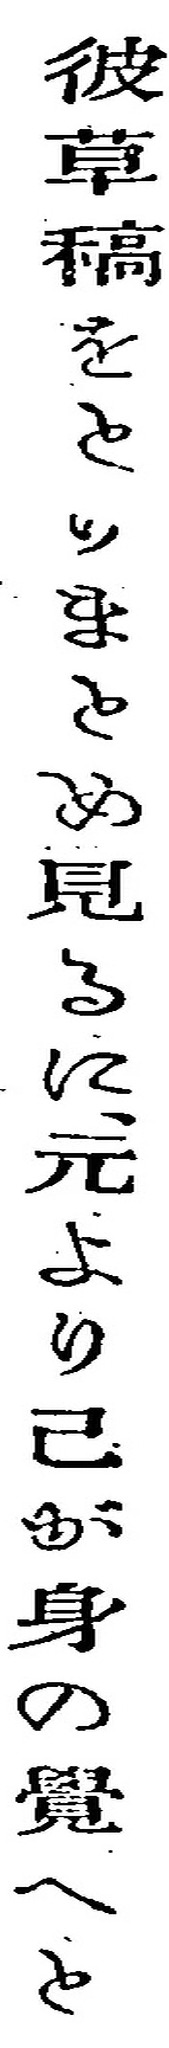彼草稿をとりまとめ見るに、元より己が身の覚へと
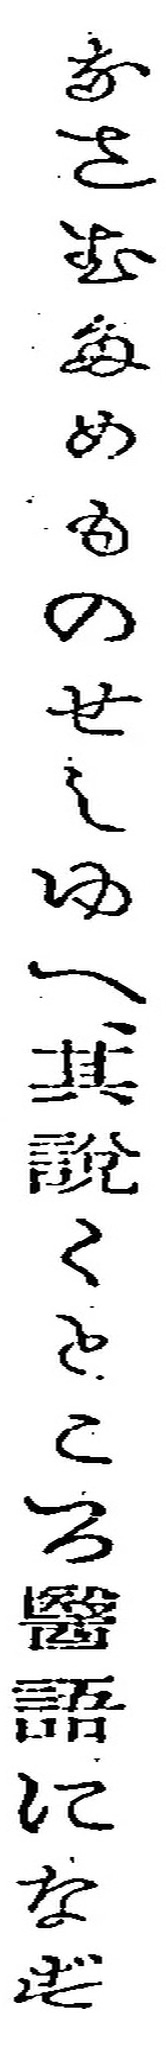なさむまめのとせしゆへ、其説くところ醫語になず
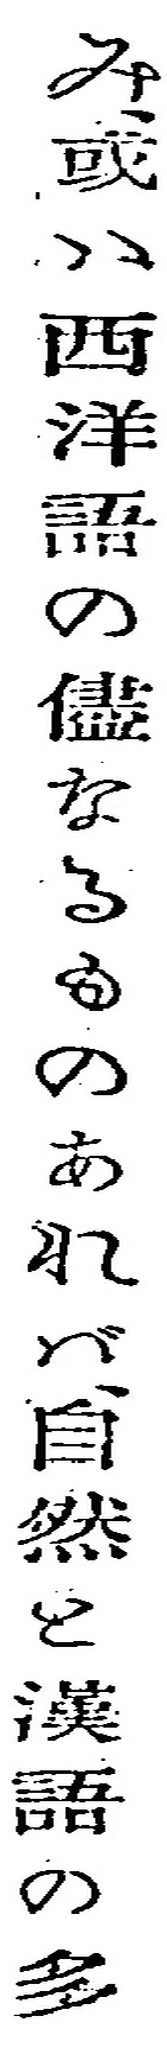み、或は西洋語の儘なるものあれば、自然と漢語の多
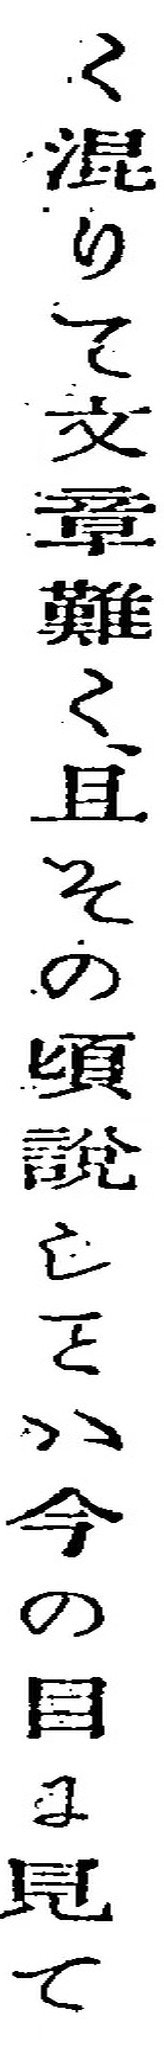く混りて文章難く、且その頃説しことは今の目に見て
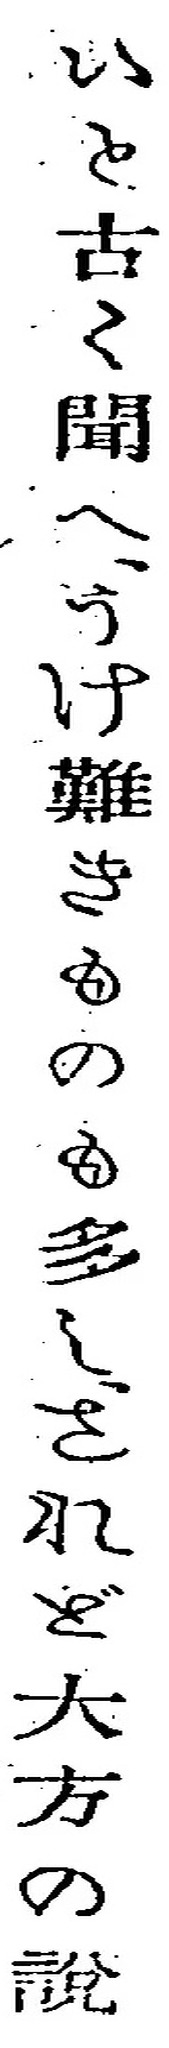いと古く聞へ、うけ難きものも多し、されど大方の説
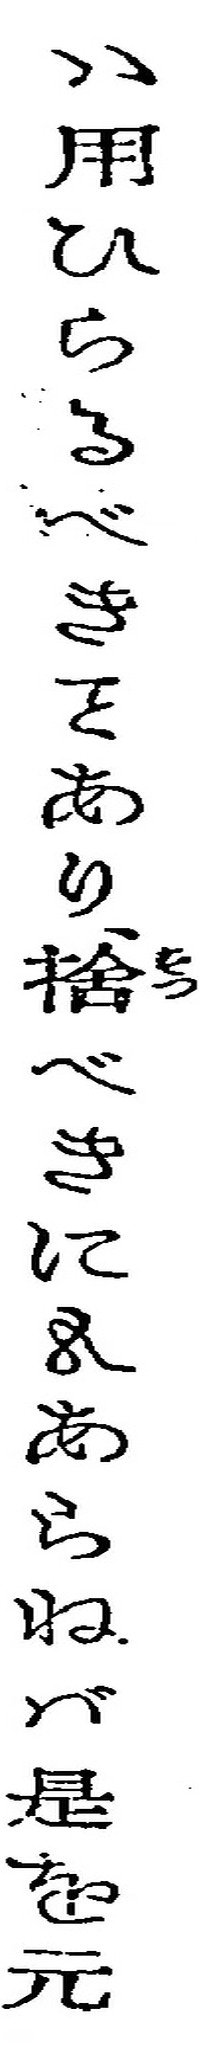は用ひらるべきことあり、捨べきにもあれねば是を元
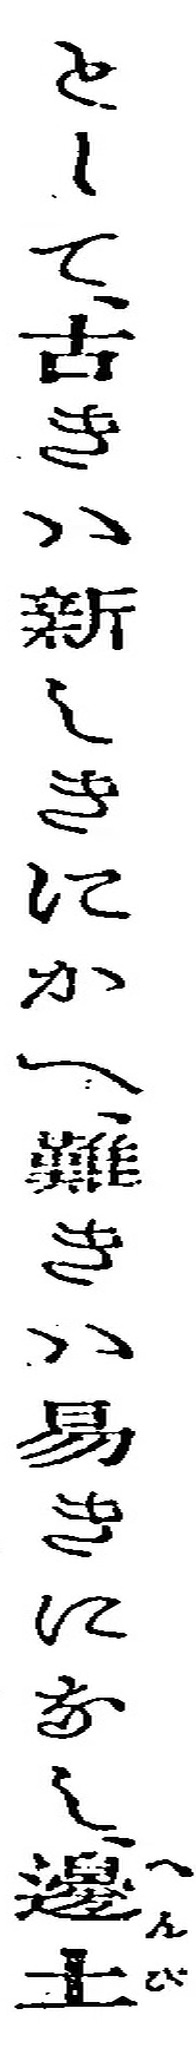として、古きは新しきにかへ、難きは易きになし、辺土
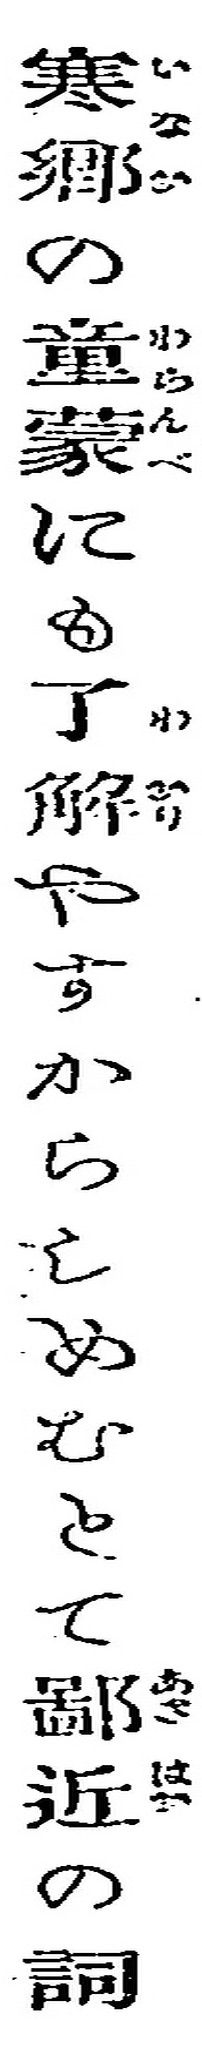寒郷の童蒙にも了解やすからしめむとて鄙近の詞
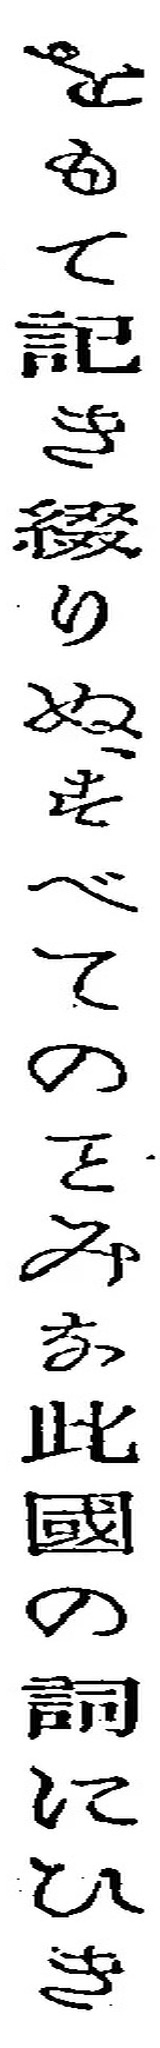をもて記き綴りぬ、すべてのことみな此國の詞にひき
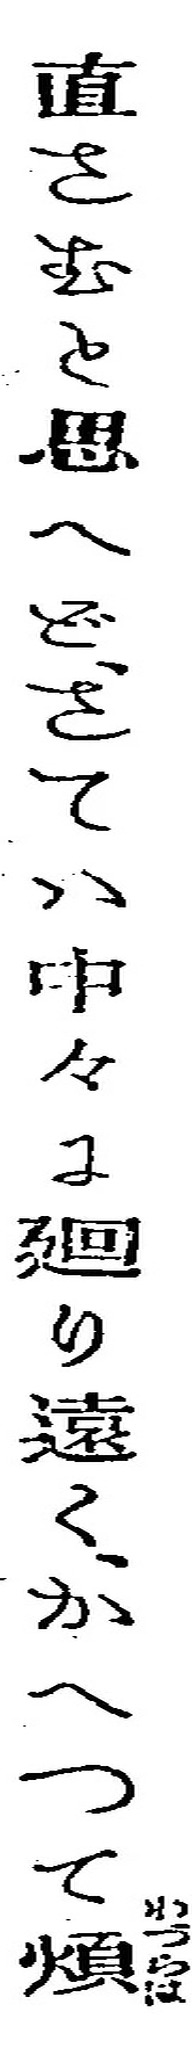直さむと思へど、さては中々に廻り遠く、かへつて煩
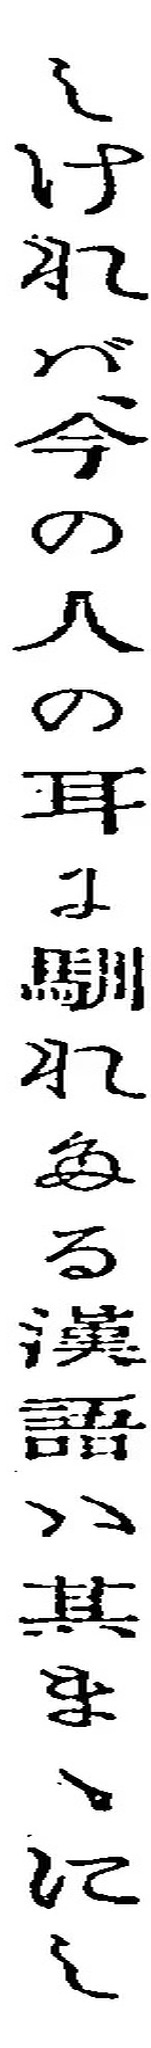しければ、今の人の耳に馴れたる漢語は其まゝにし
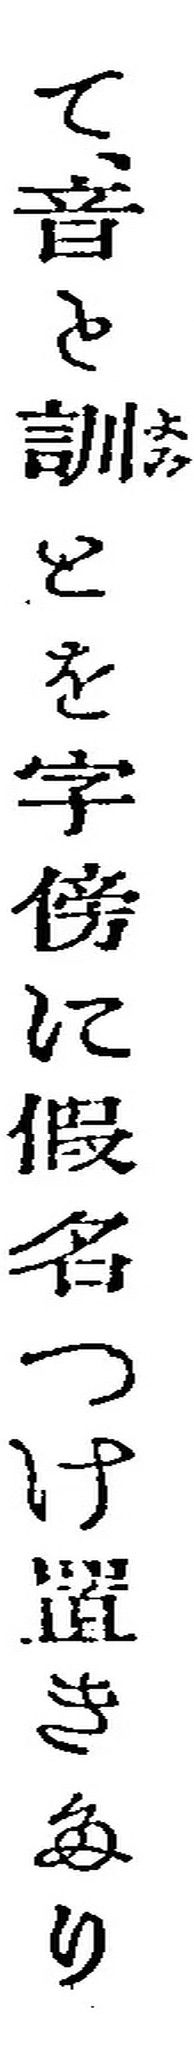て、音と訓とを字傍に假名つけ置きたり
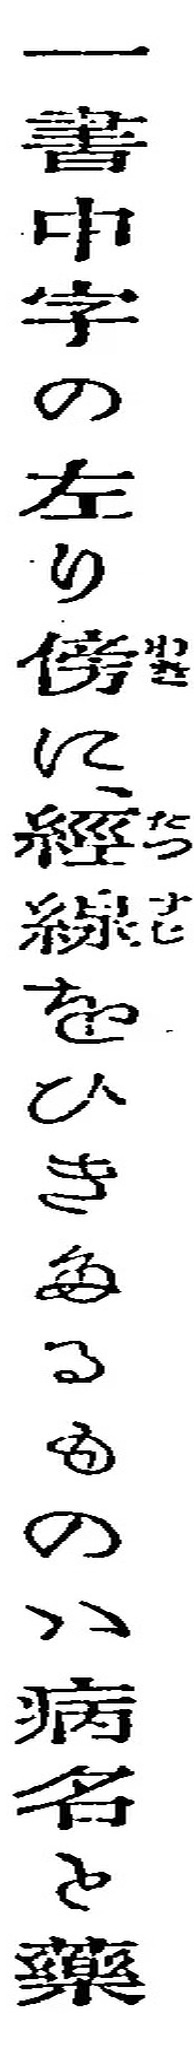一書中字の左り傍に、経線をひきたるものは病名と藥
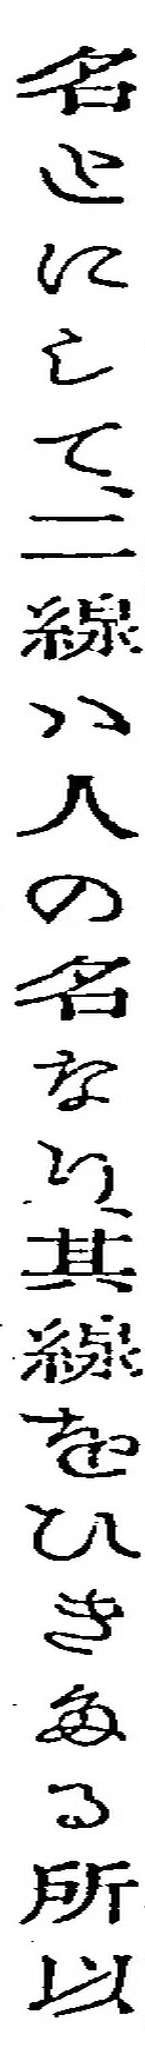名にして、二線は人の名なり、其線をひきたる所以
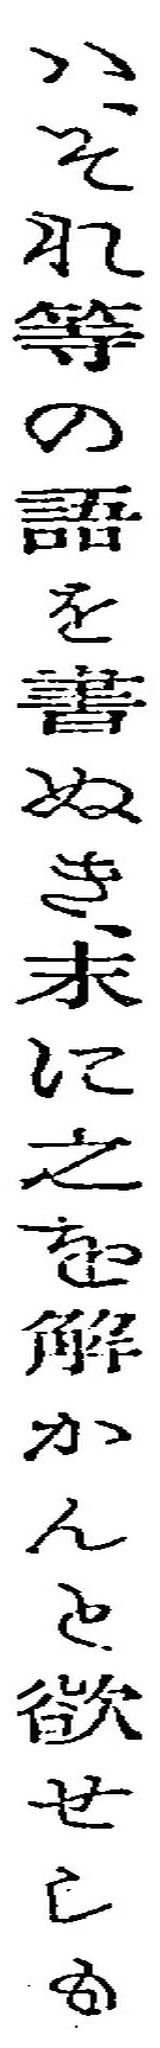は、それ等の語を書ぬき、末に之を解かんと欲せしも
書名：飲水の心得 : 伝染病の予防
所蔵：国立国会図書館 National Diet Library, JAPAN
